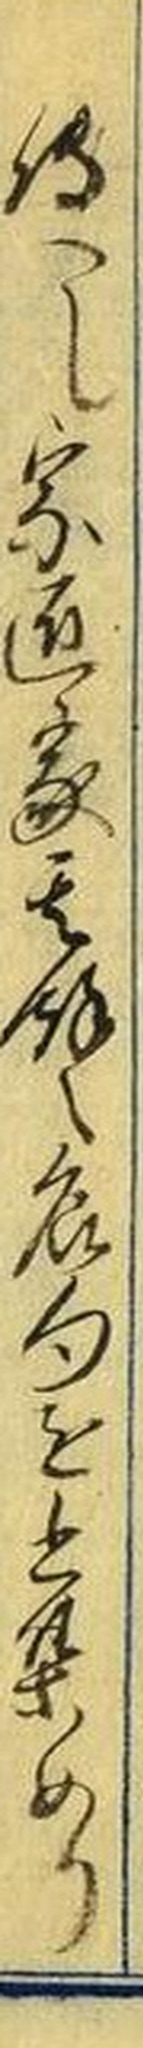伝へし宗匠家其余之名句を書集めり
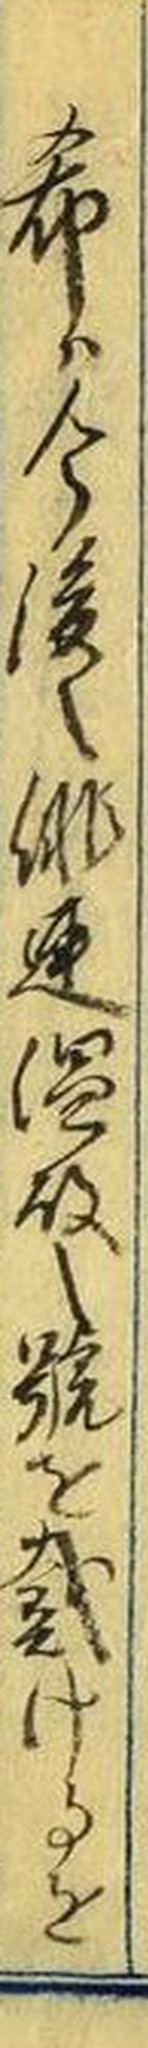希は今後之俳連温故之号を戴けるを
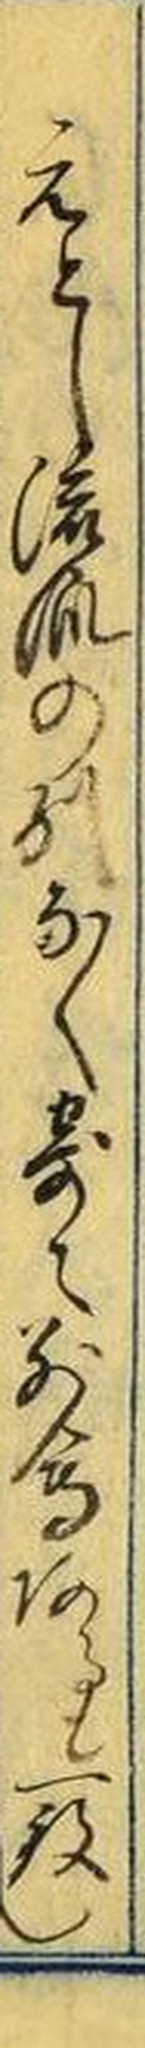元とし流派の別なく寄之別会あるも一致し

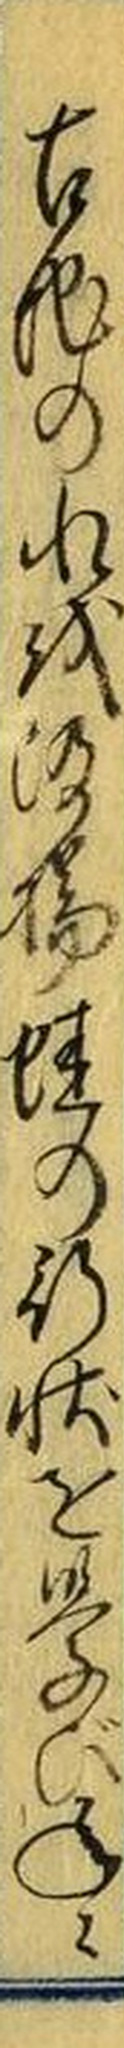古池の水を汲揚蛙の行状を学び年々
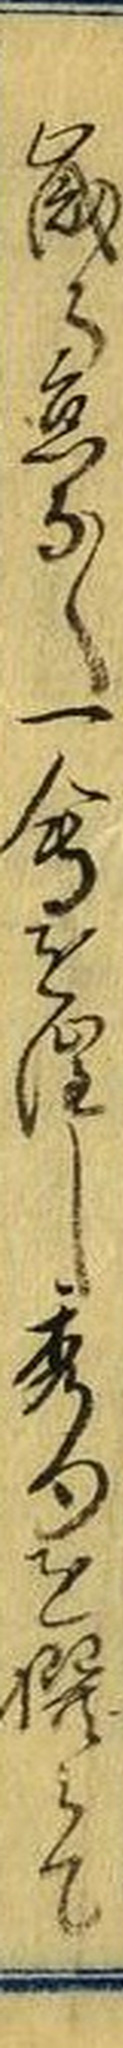歳々怠なく一会を催し秀句を撰みて
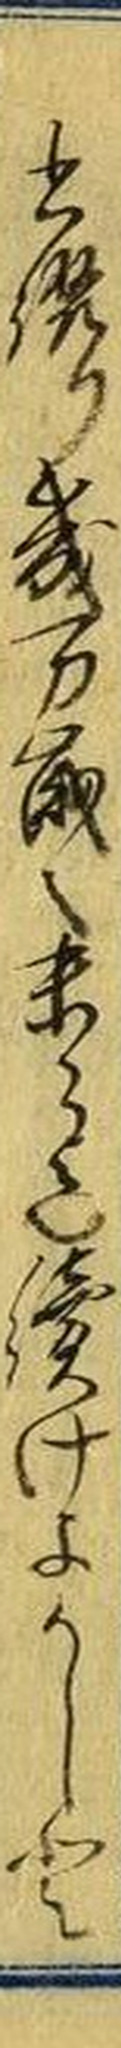書綴り幾万歳之末々迄続けよかしと
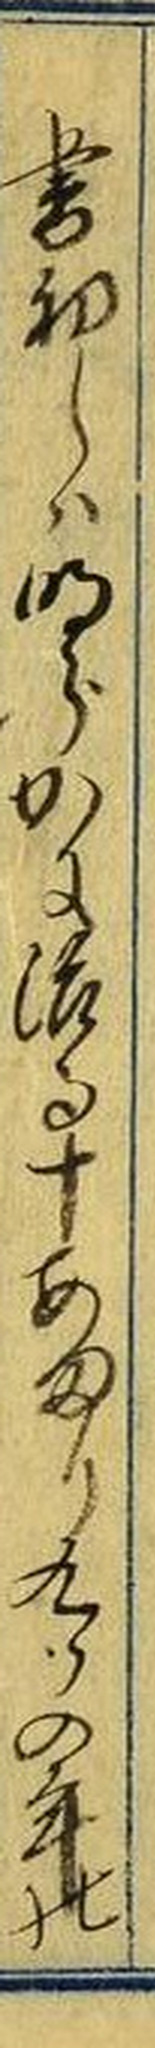書初しは明らかに治る十あまり九つの年の
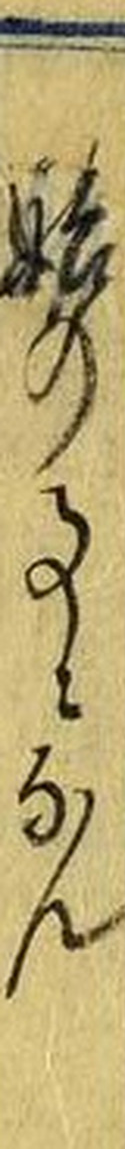始の事になん
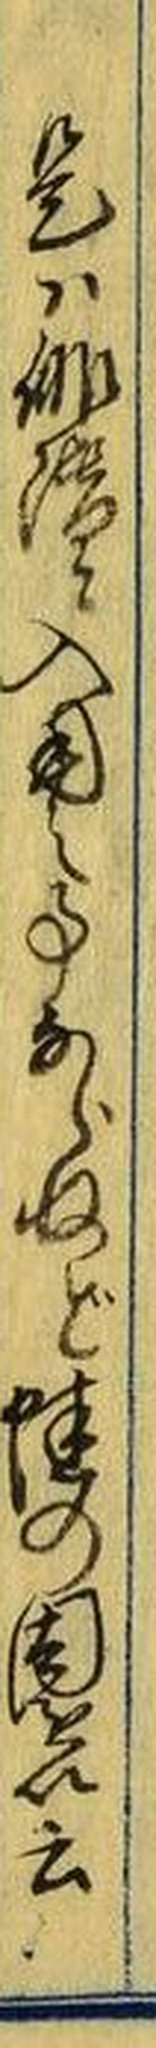是は俳諧に入用之事ならねど蛙の園を以云
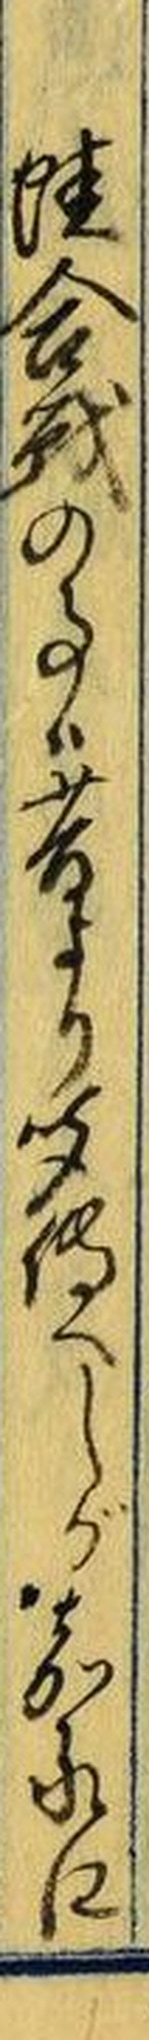蛙合戦の事は昔より聞伝へしが嘉永四
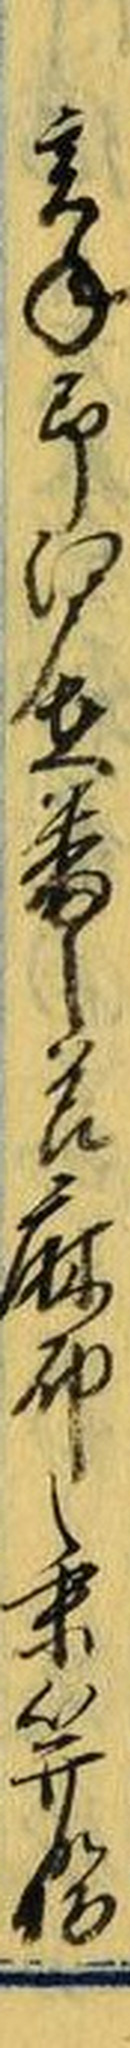亥年即江戸在番之節麻布之末笄橋
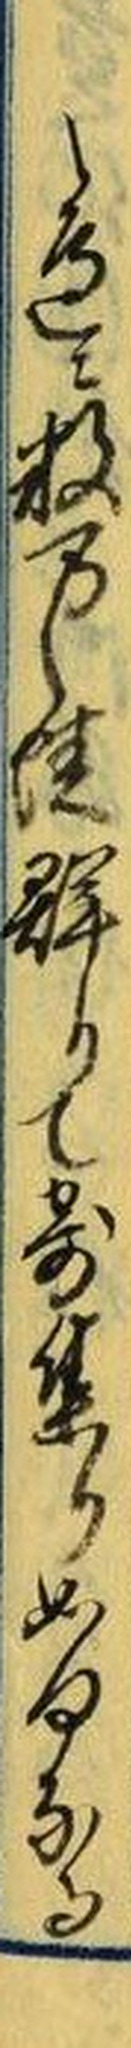之辺に数万之蛙群りて寄集り如何なる
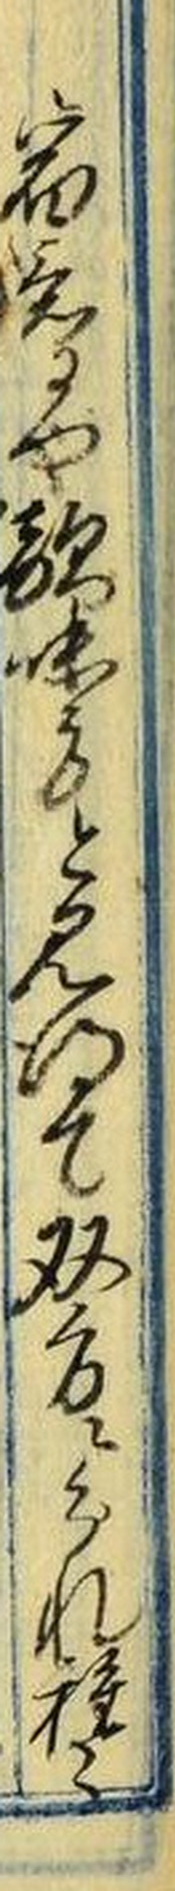宿意にや敵味方と見得て双方に分れ種々
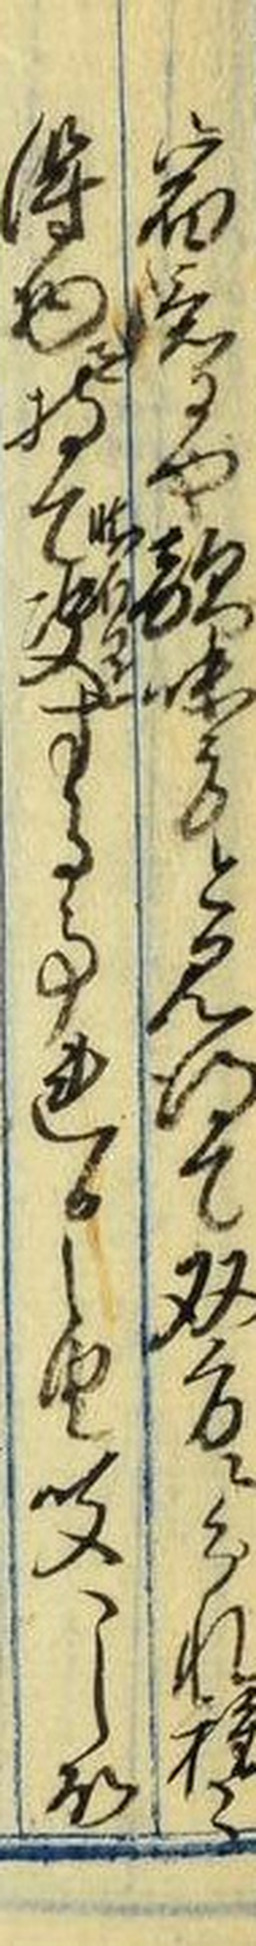得物を持て決する事連日之由聞へし故
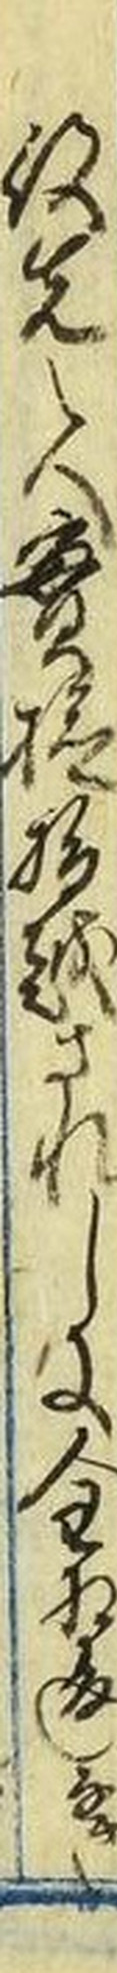役先之人実検指越されしに全相違なき
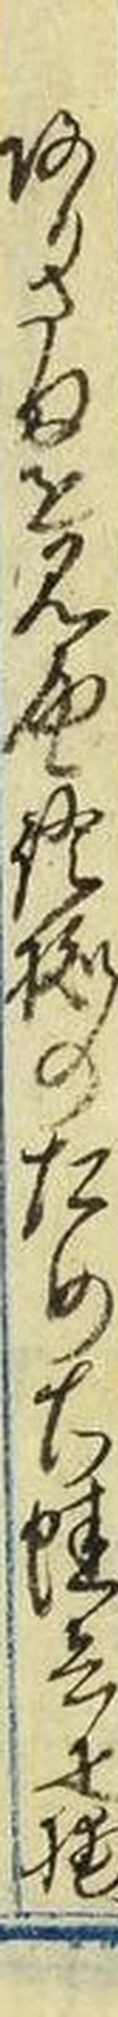ありさまを見届証拠のため右蛙壱疋捕へ
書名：温古集 三巻
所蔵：福井県文書館 Fukui Prefectural Archives
